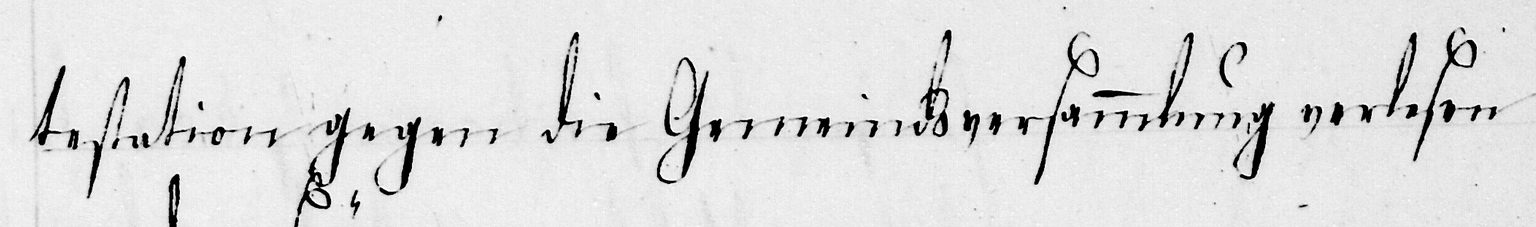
testation gegen die Gemeindsversammlung verlesen
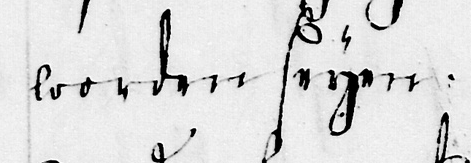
worden seyen.
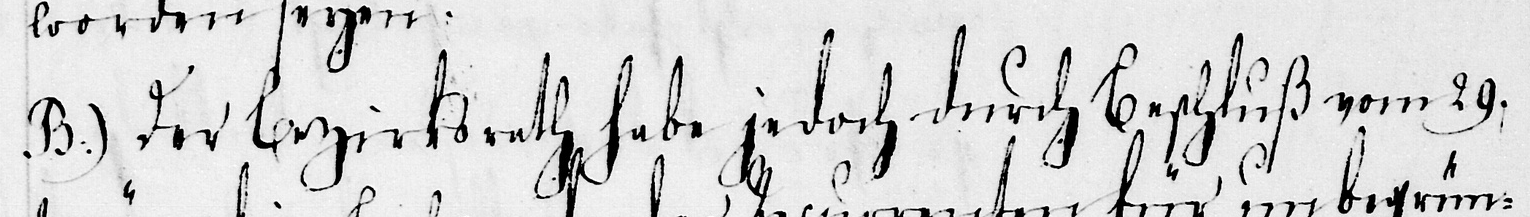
B.) Der Bezirksrath habe jedoch durch Beschluß vom 29.
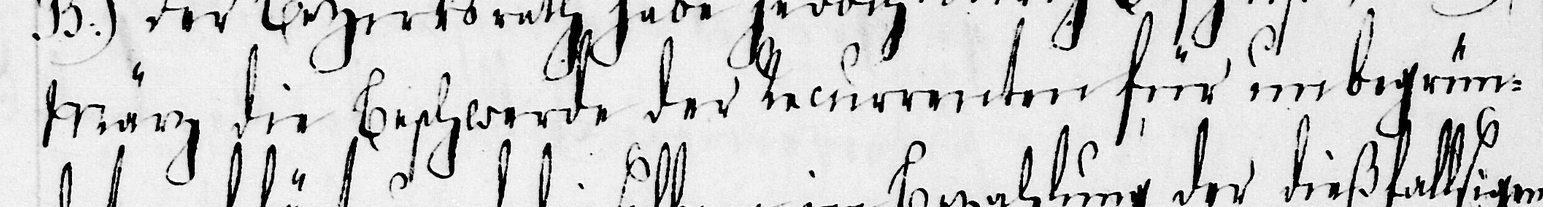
März die Beschwerde der Recurrenten für unbegrün¬
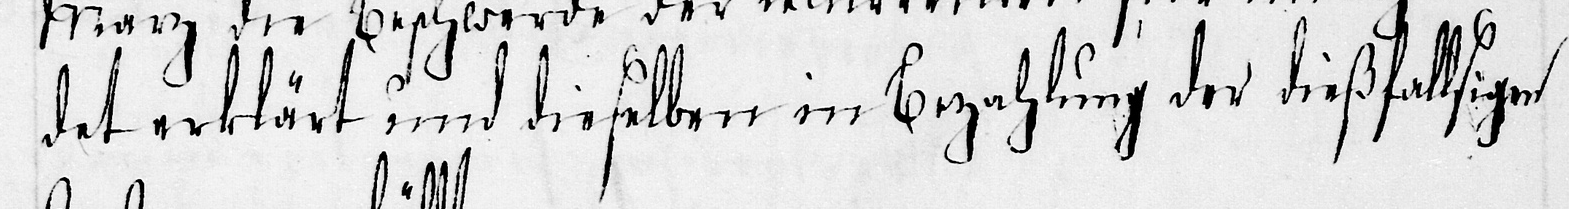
det erklärt und dieselben in Bezahlung der dießfallsigen
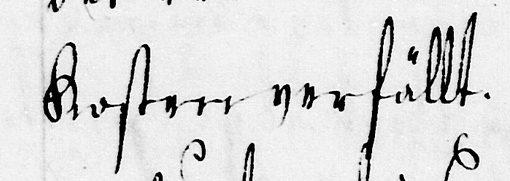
Kosten verfällt.
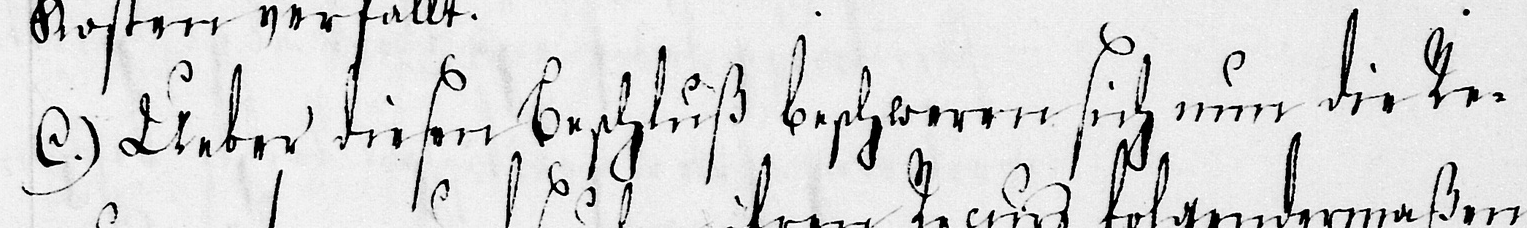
C.) Ueber diesen Beschluß beschweren sich nun die Re¬
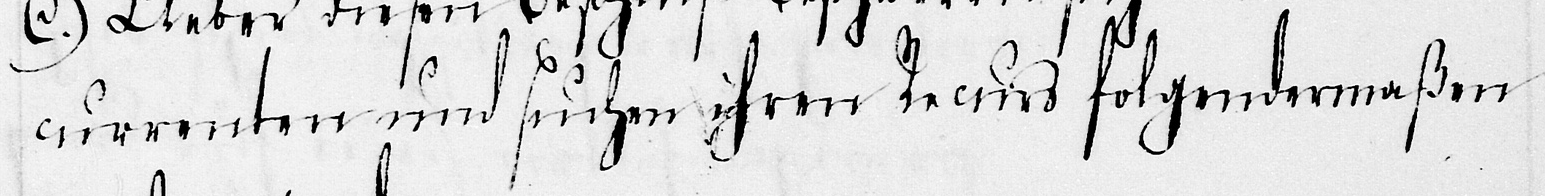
currenten und suchen ihren Recurs folgendermaßen
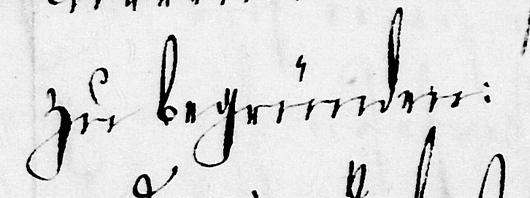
zu begründen:
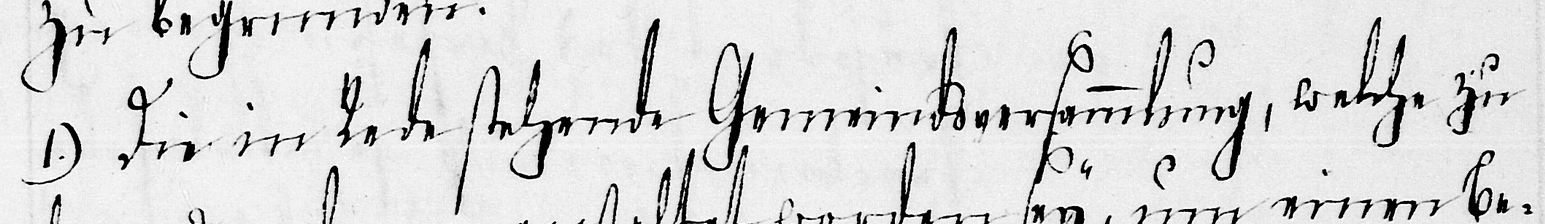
1.) Die in Rede stehende Gemeindsversammlung, welche zu
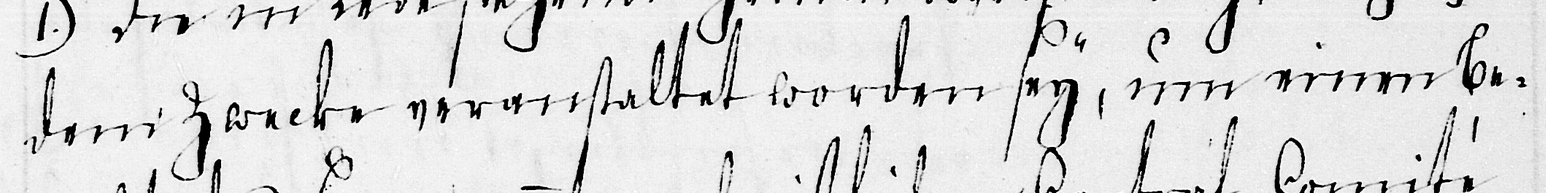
dem Zwecke veranstaltet worden sey, um einen Be¬
